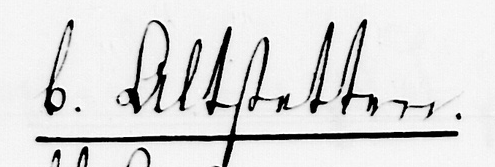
b. Altstetten.
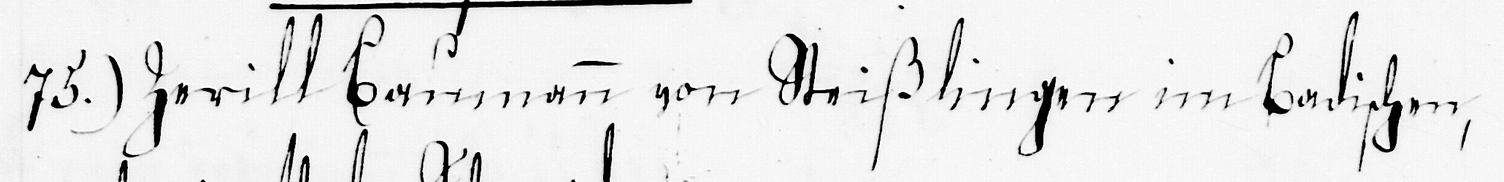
75.) Zerill Baumann von Steißlingen im Badischen,
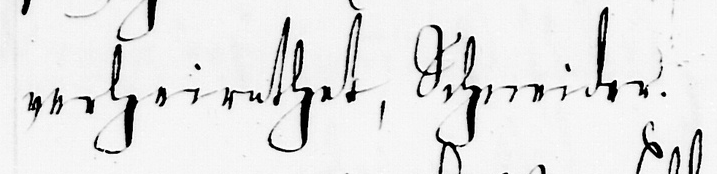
verheirathet, Schneider.
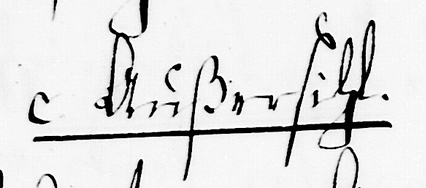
c Außersihl.
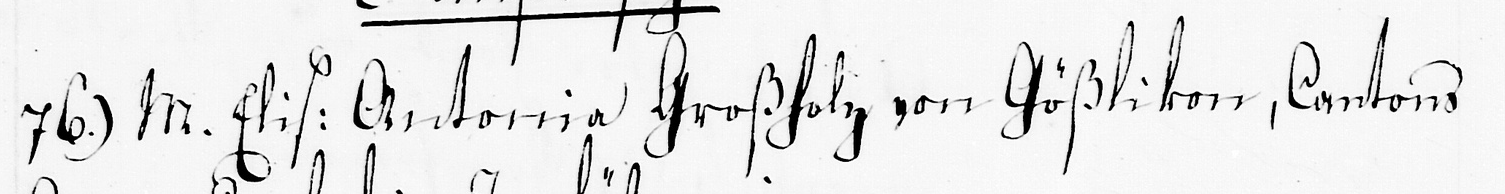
76.) M. Elis: Antonia Großholz von Gößlikon, Cantons
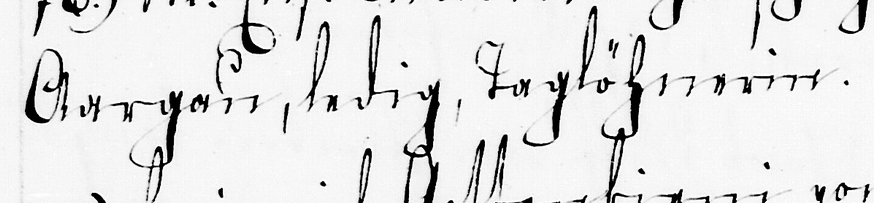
Aargau, ledig, Taglöhnerin.
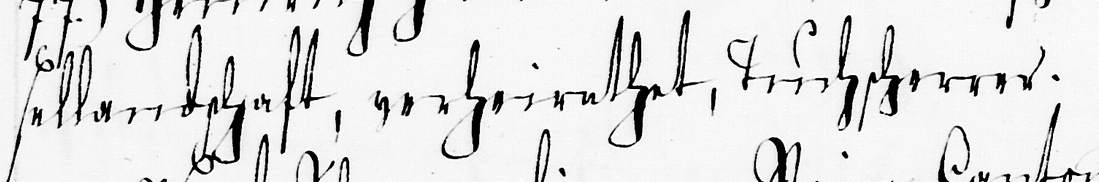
sellandschaft, verheirathet, Tuchscherrer.
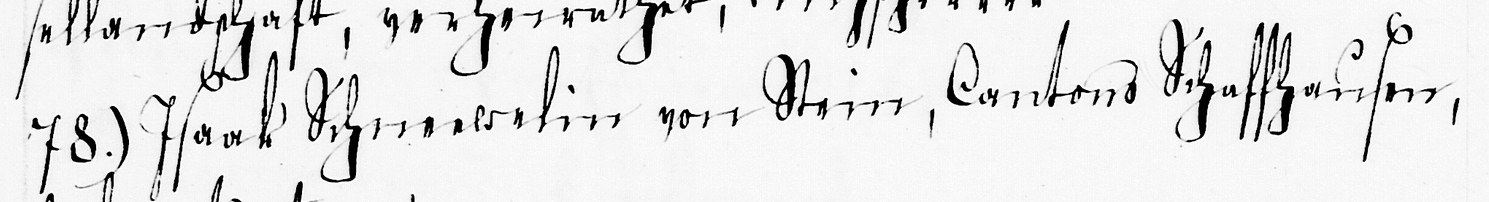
78.) Isaak Schneewelin von Stein, Cantons Schaffhausen,
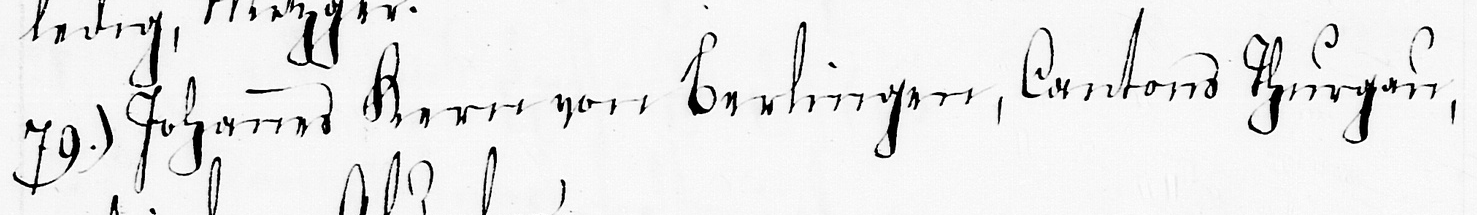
79.) Johannes Kern von Berlingen, Cantons Thurgau,
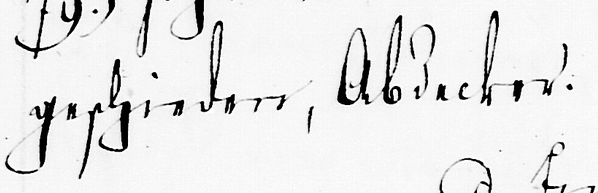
geschieden, Abdecker.
